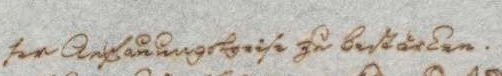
ser Anschauungsweise zu bestärken.
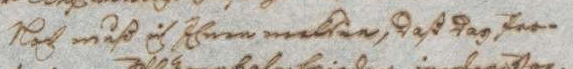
Noch muß ich Ihnen melden, daß das Pro-
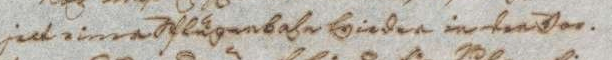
ject einer Splügenbahn wieder in den Vor-
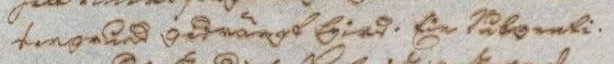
dergrund gedrängt wird. Ein Subventi-
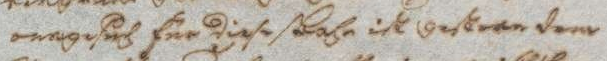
onsgesuch für diese Bahn ist gestern dem
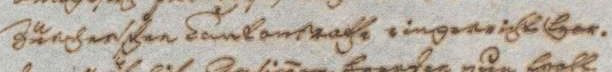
Züricher'schen Cantonsrathe eingereicht wor-
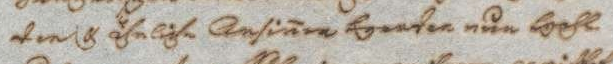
den & ähnliche Ansinnen werden nun wohl
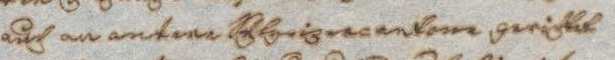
auch an andere Schweizercantone gerichtet
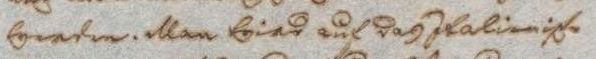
werden. Man wird auf das Italienische
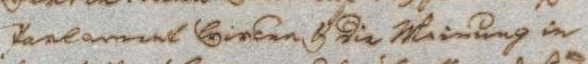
Parlament wirken & die Meinung in
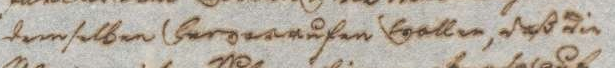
demselben hervorrufen wollen, daß die
